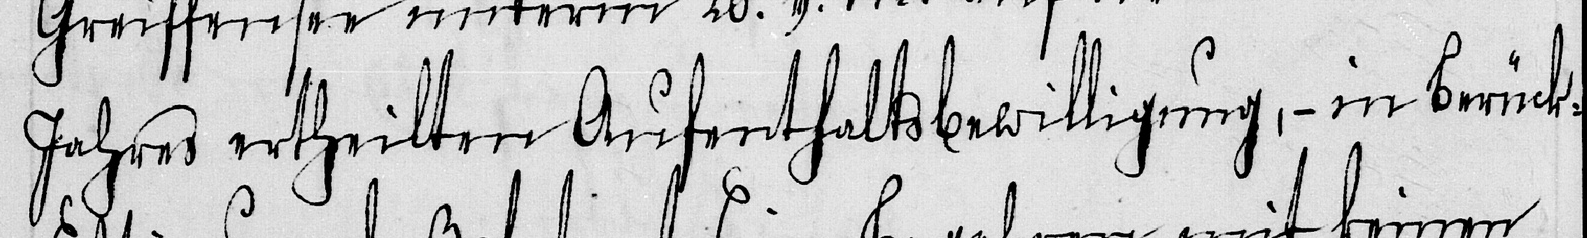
Jahres ertheilten Aufenthaltsbewilligung, – in Berück¬
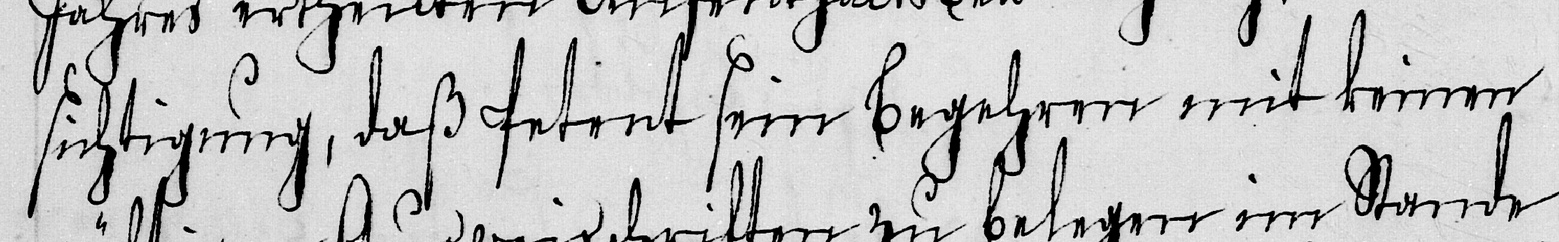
sichtigung, daß Petent sein Begehren mit keinen
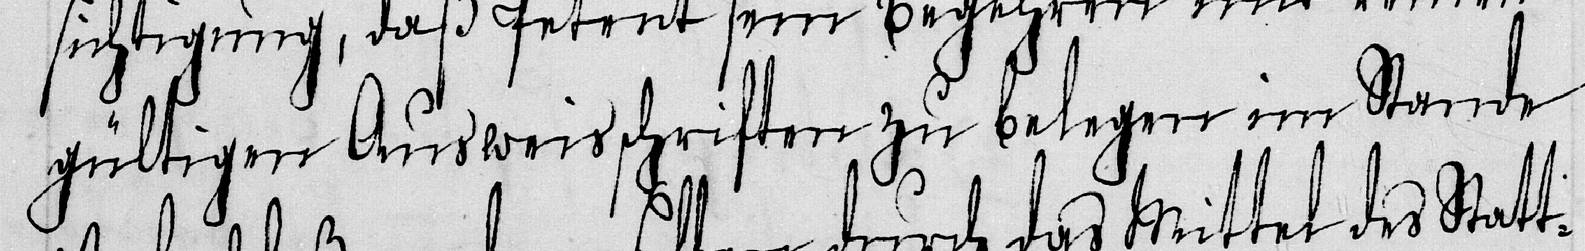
gültigen Ausweisschriften zu belegen im Stande
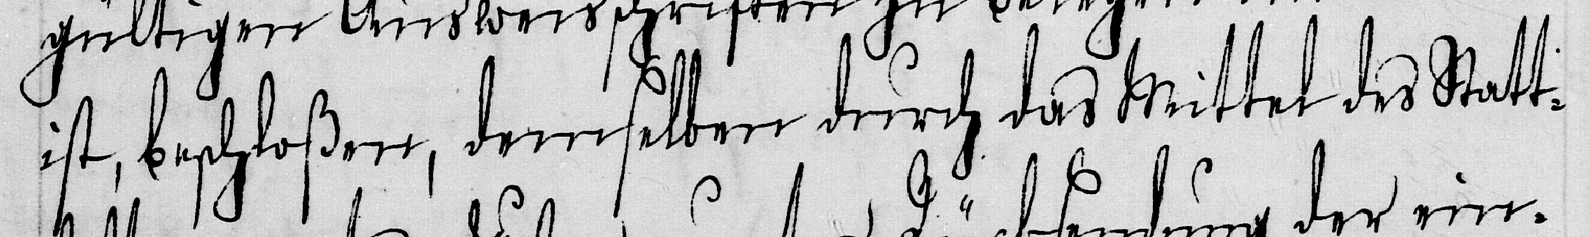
ist, beschloßen, demselben durch das Mittel des Statt¬
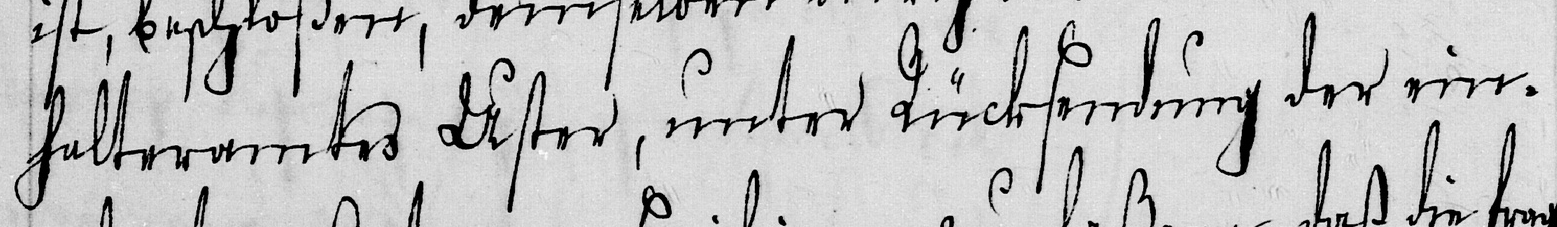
halteramtes Uster, unter Rücksendung der ein¬
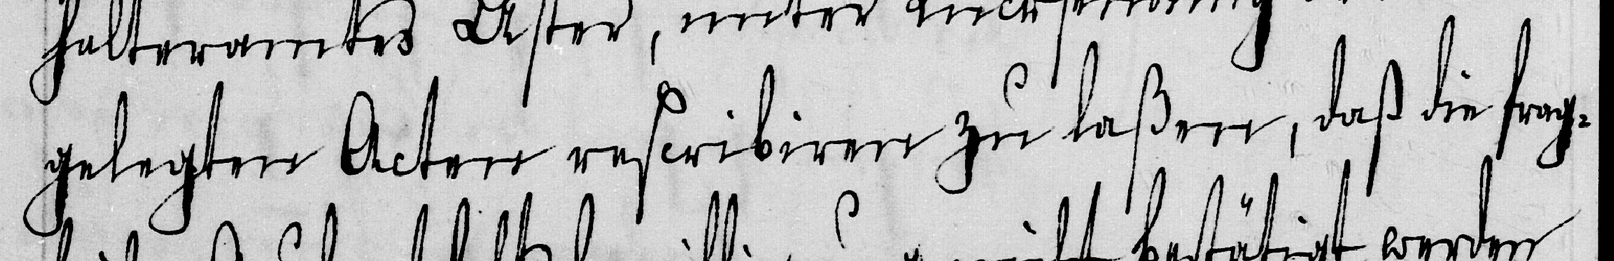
gelegten Acten rescribiren zu laßen, daß die fra¬
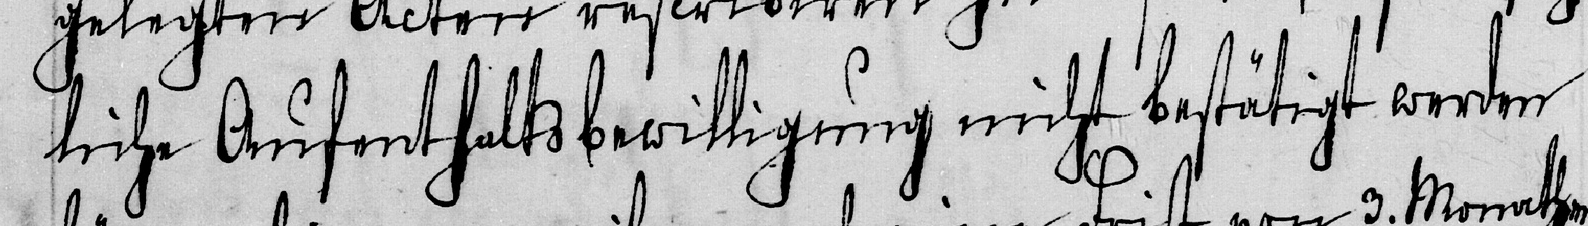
gliche Aufenthaltsbewilligung nicht bestätigt werden
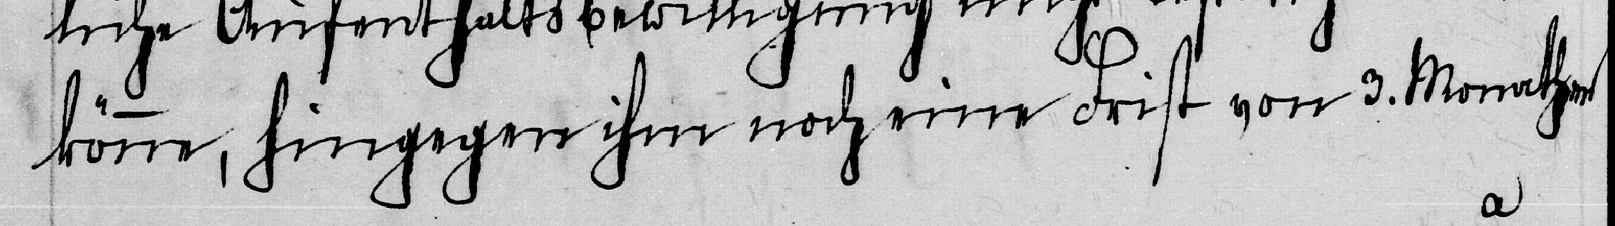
könne, hingegen ihm noch eine Frist von 3. Monathen
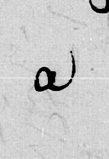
4.)
